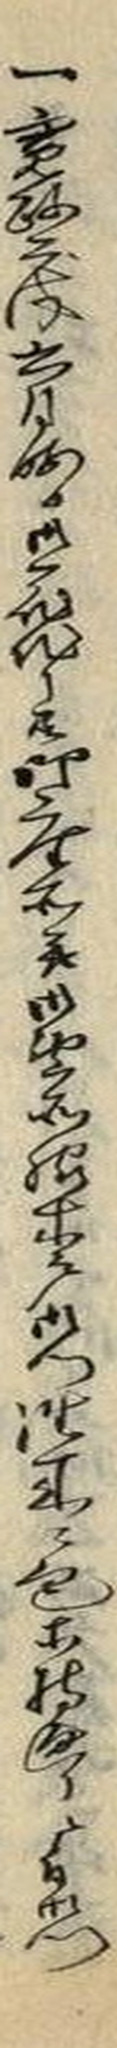一寛政二戌六月朔日御花作り共御座所并御台所脇木戸御門往来に包等持通候に付御門
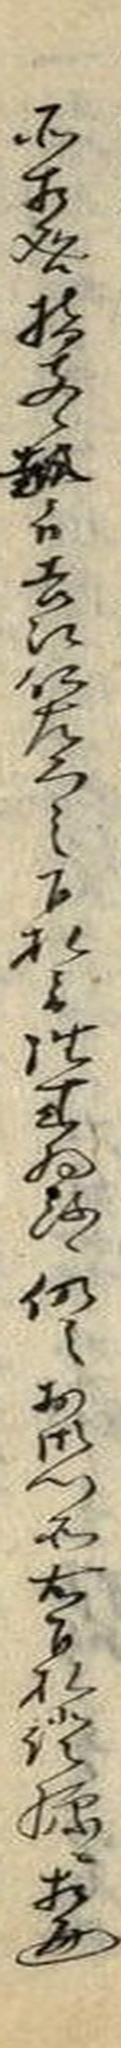所相咎指支候趣に付吉江仁左衛門之下札に而往来為致候仍之於御門所右下札証拠に相通
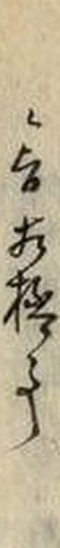候旨相極候事
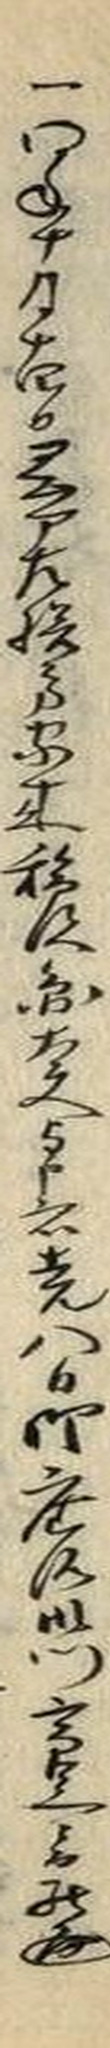一同年十月十四日岡部左善方家来稲沢円太夫と申者去ル八日御座所御門高足に而罷通
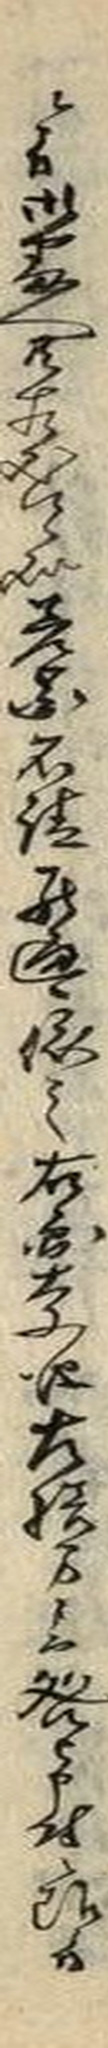候に付御番人共相咎候処差図不請罷通候依之右円太夫儀左善方に而咎被申付候趣に付
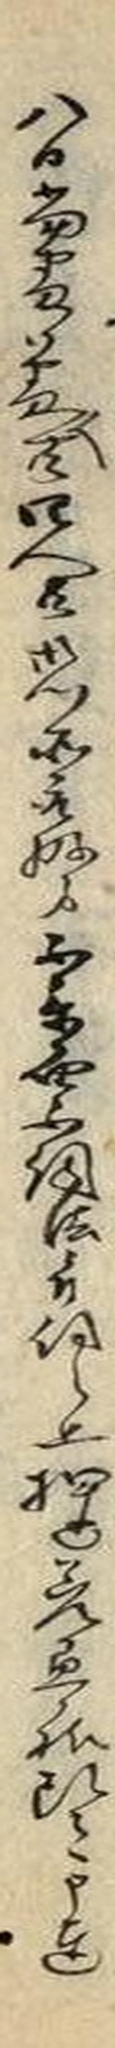八日当番御番人共四人御門所取扱方不参届不調法に付伺之上押込差置候様頭々へ申達
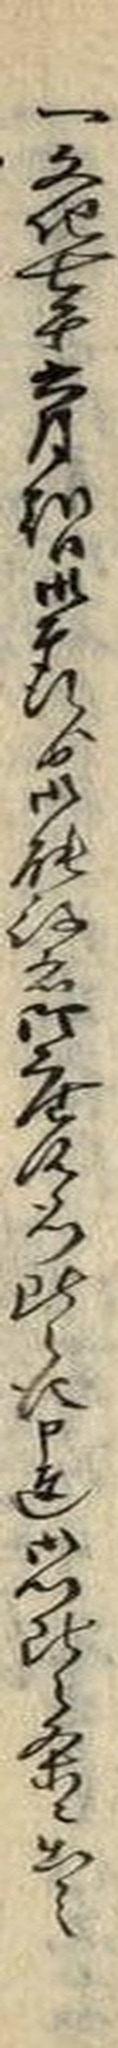一文化七午六月朔日御奉行ゟ御能役者御座所御門断之儀申達御門断之条に出之
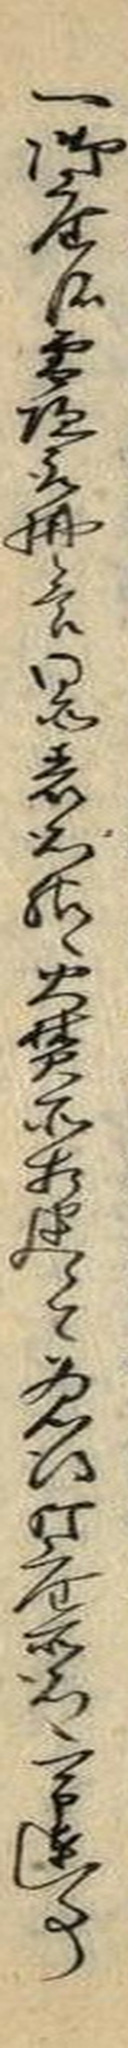一御座所雪垣取払候節同所表御門脇へ火焚所相建候はゝ為心得御座所御門へ可相達候事

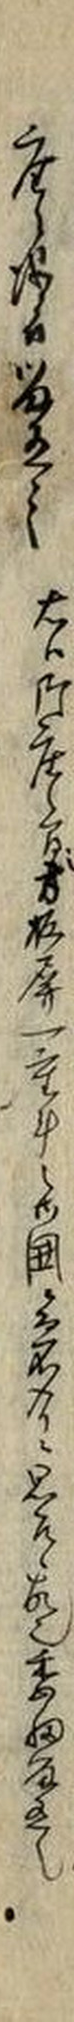座之儀ニ付留有之右ハ御座之間之方板塀一重斗之御囲ニ而不〆りニ思召候故也委細留有之
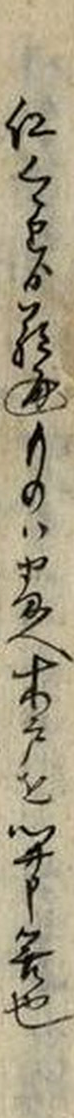但くゝりゟ難通ものは番人木戸を開申筈也
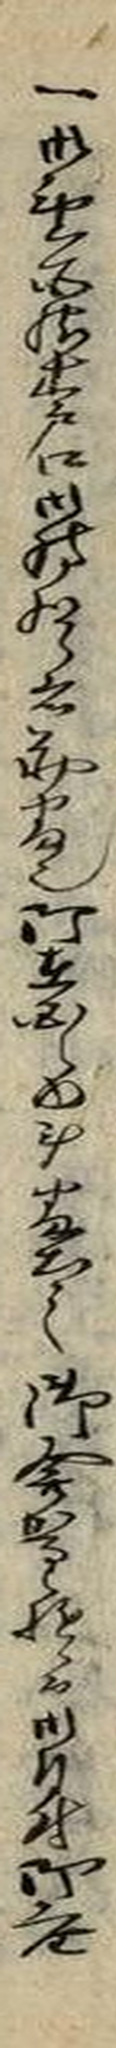一御台所脇木戸口御持組之者勤番也御在国之内斗番出之御発駕被遊候而御目付御座
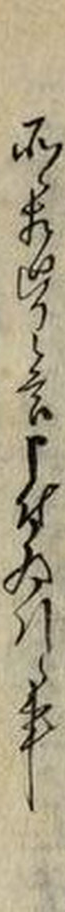所へ相廻り候節申付為引候事
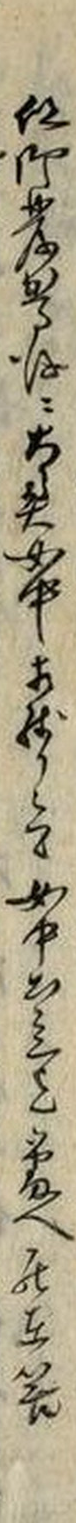但御発駕後に大奥女中相残り候ハヽ女中出立迄御番人罷在筈
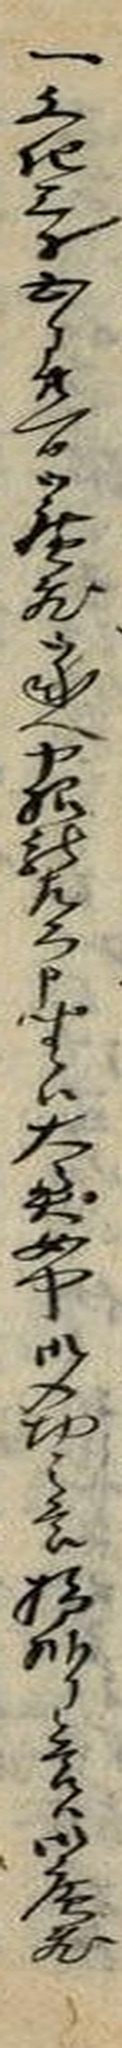一文化三寅五月廿一日御広敷御用人中根新左衛門申聞候ハ大奥女中御〆切之節指掛り之節ハ御広敷
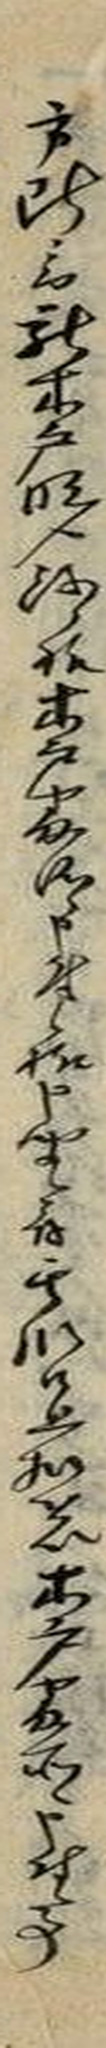方断ニ而新木戸明〆致候様木戸番所へ申付候様申聞候ニ付其段口上扣を以木戸番所へ申付候事
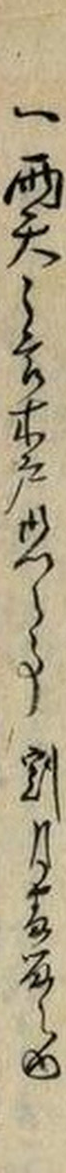一雨天之節木戸御門之事割月番留之内
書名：御門御櫓之部
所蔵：福井県文書館 Fukui Prefectural Archives
